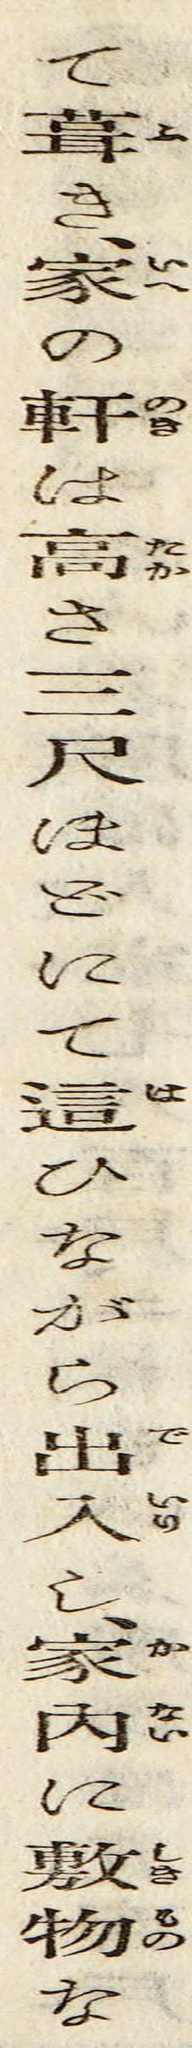て葺き、家の軒は高さ三尺ほどにて這ひながら出入し、家内に敷物な
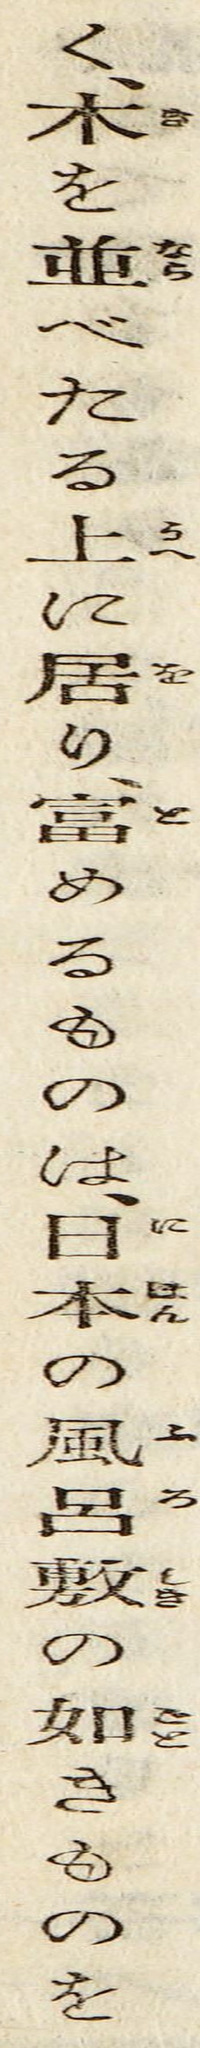く、木を並べたる上に居り、富めるものは、日本の風呂敷の如きものを

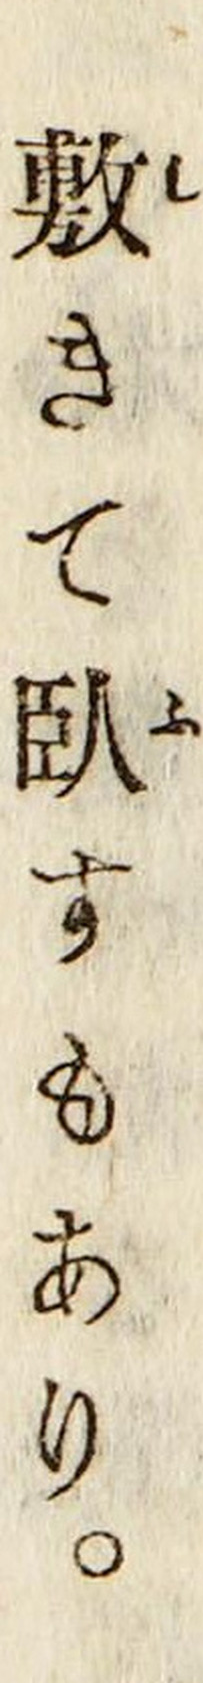敷きて臥すもあり。
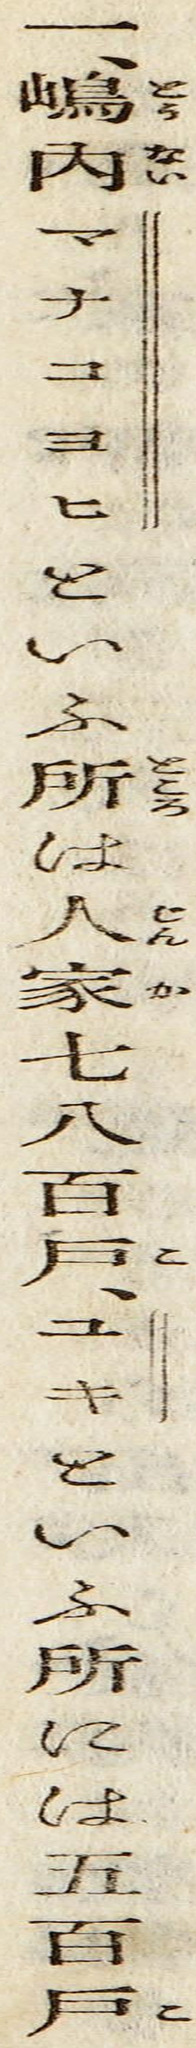一、嶋内マナコヨヒといふ所は人家七八百戸、ユキといふ所には五百戸
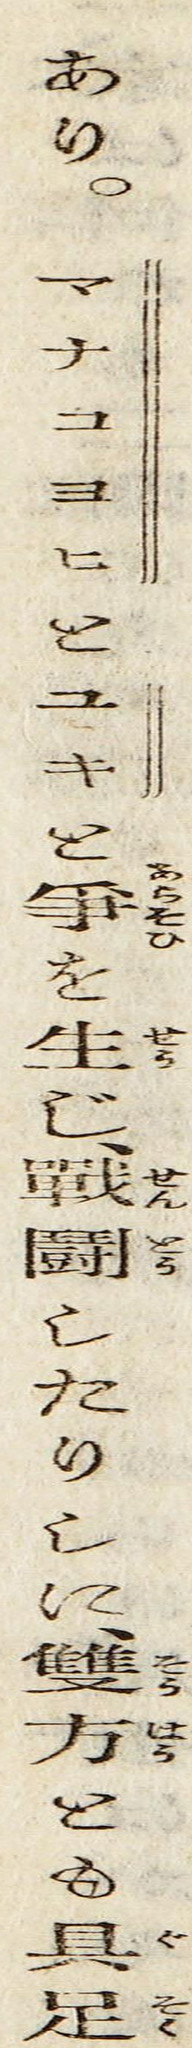あり。マナコヨヒとユキと争を生じ、戦闘したりしに、双方とも具足
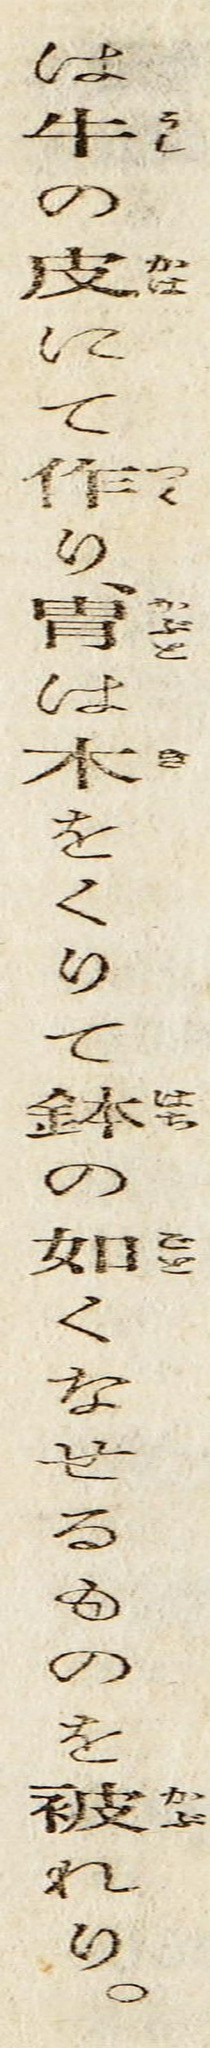は牛の皮にて作り、冑は木をくりて鉢の如くなせるものを被れり。
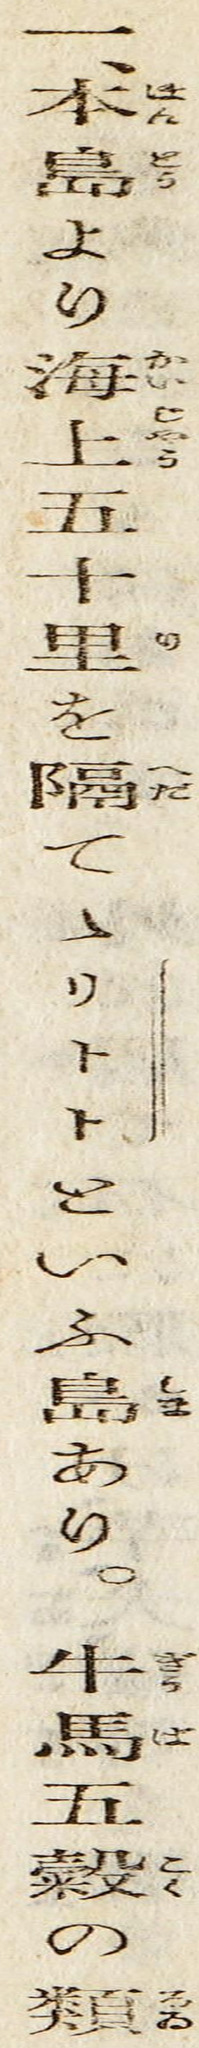一、本島より海上五十里を隔てゝリトトといふ島あり。牛馬五穀の類
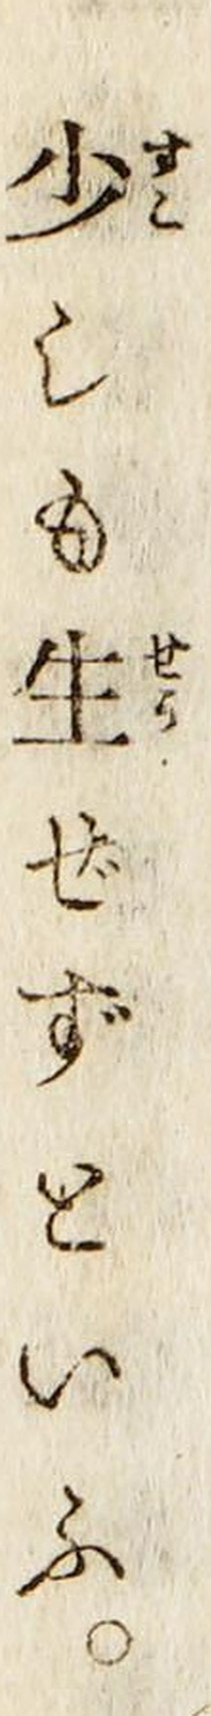少しも生せずといふ。
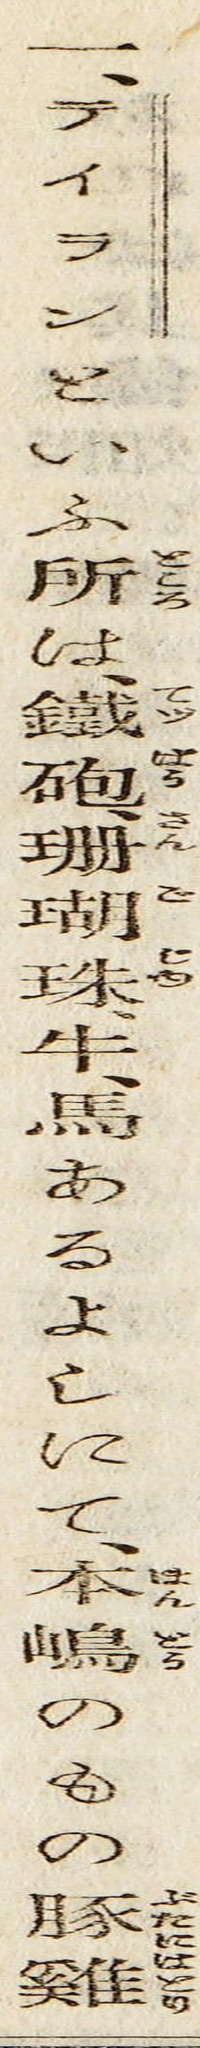一、テイランといふ所は、鉄砲、珊瑚珠、牛、馬あるよしにて、本嶋のもの豚鶏
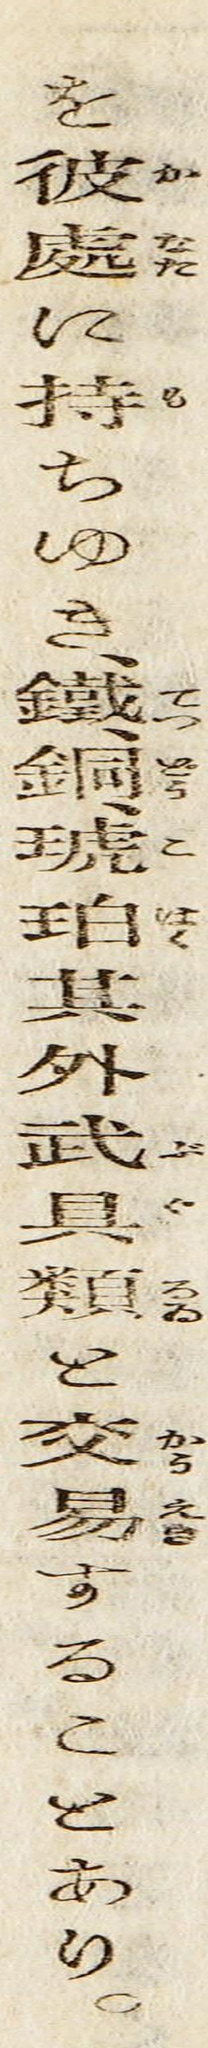を彼処に持ちゆき、鉄、銅、琥珀其外武具類と交易することあり。
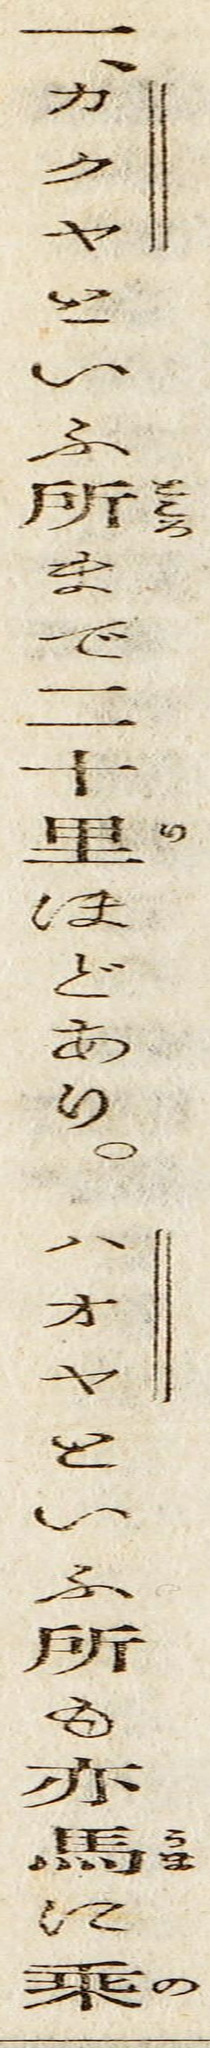一、カクヤというふ所まで二十里ほどあり。ハオヤといふ所も亦馬に乗
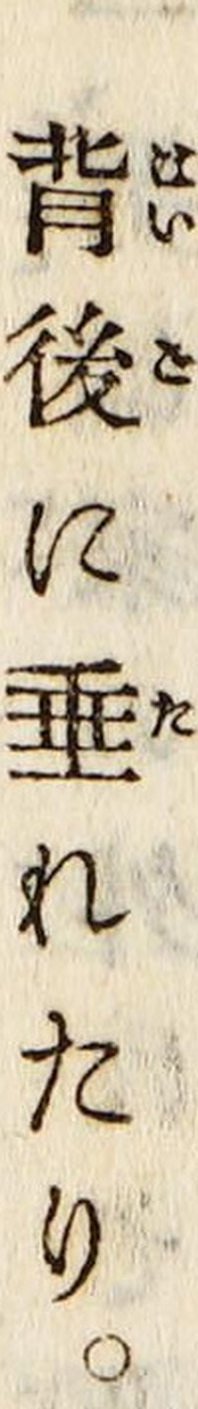背後に垂れたり。
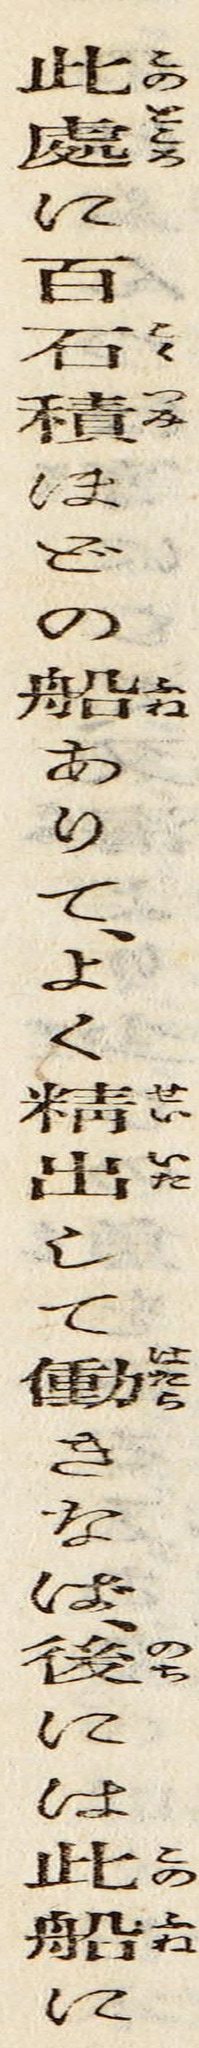此処に百石積ほどの船ありて、よく精出して働きなば、後には此船に
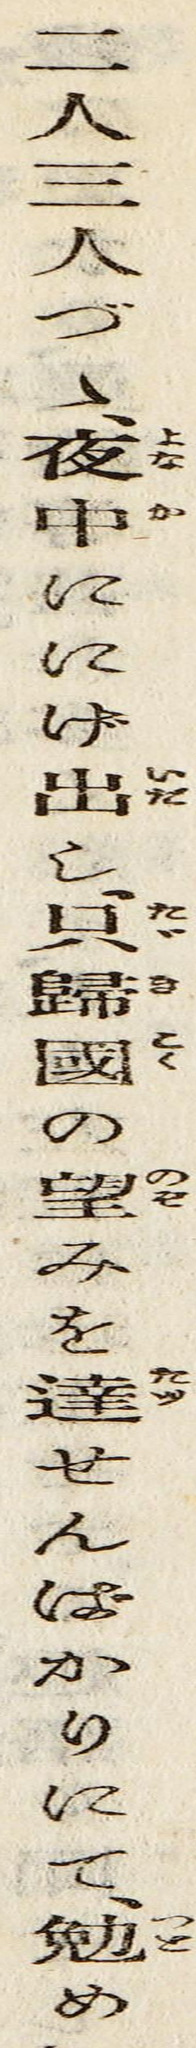二人三人づゝ、夜中ににげ出し、只帰国の望みを達せんばかりにて、勉め
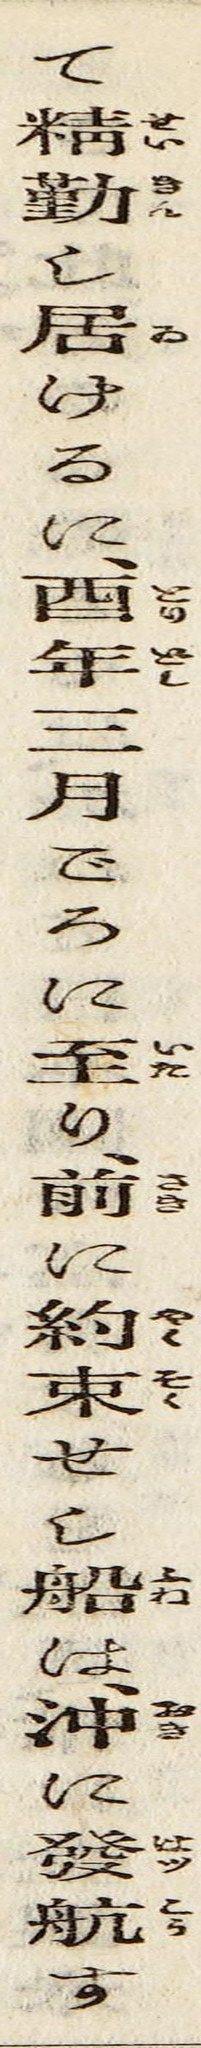て精勤し居けるに、酉年三月ごろに至り、前に約束せし船は、沖に発航す
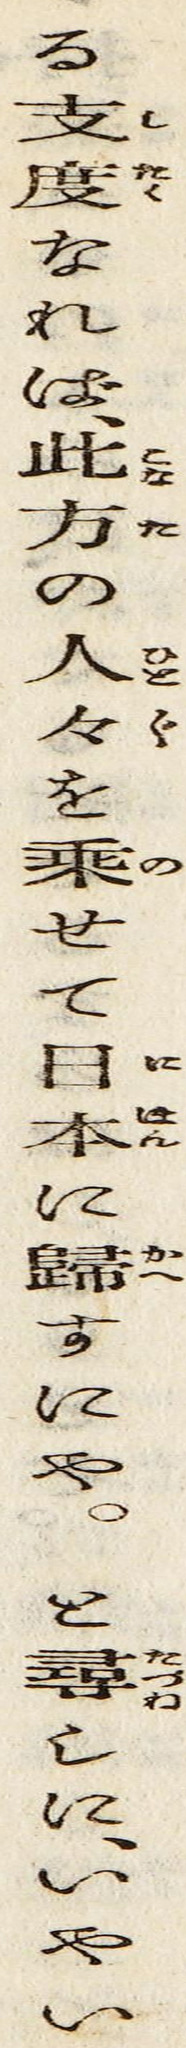る仕度なれば、此方の人々を乗せて日本に帰すにや。と尋しに、いやい
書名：日本漂流譚
